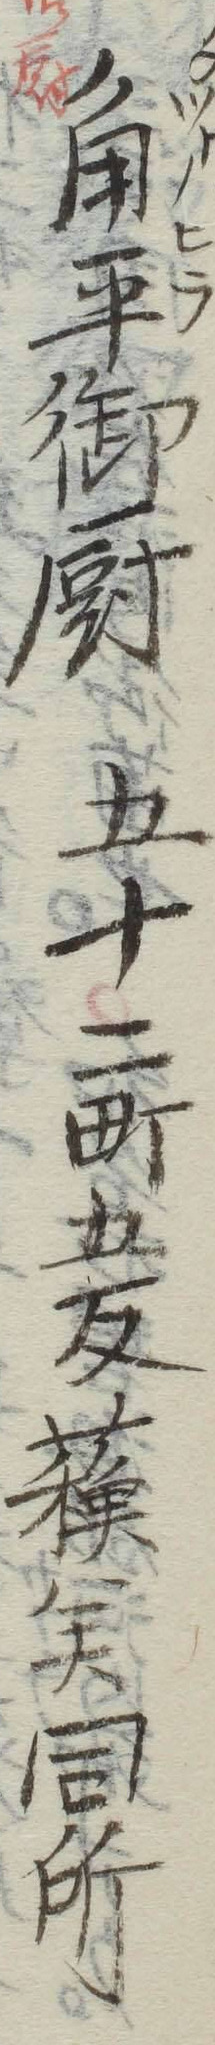角平御厨五十二町五反蘓美同所
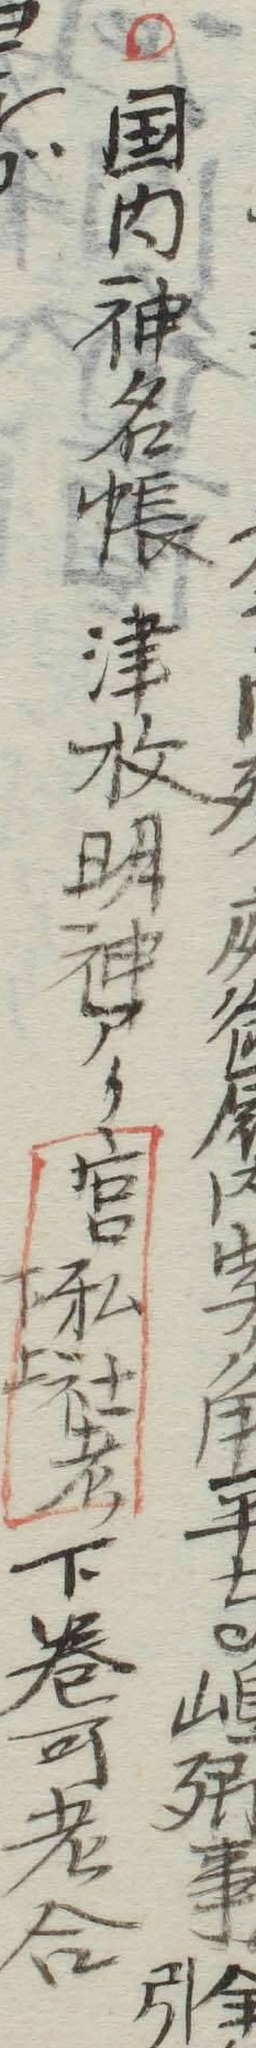○国内新名帳津枚明神アリ官私社考下巻可考合
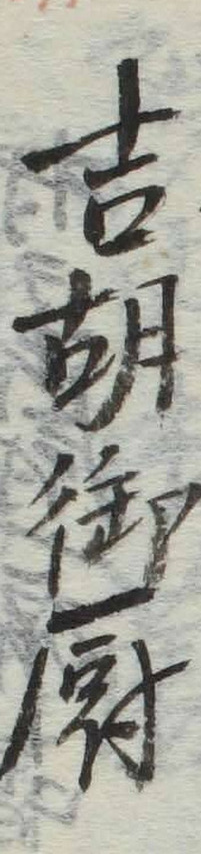吉胡御厨

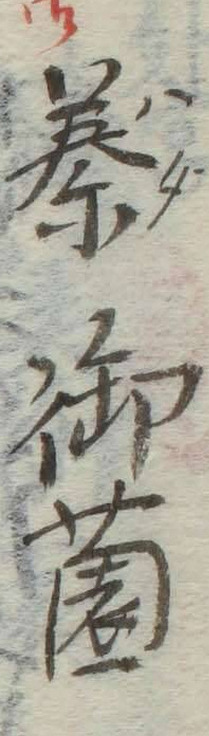秦御薗
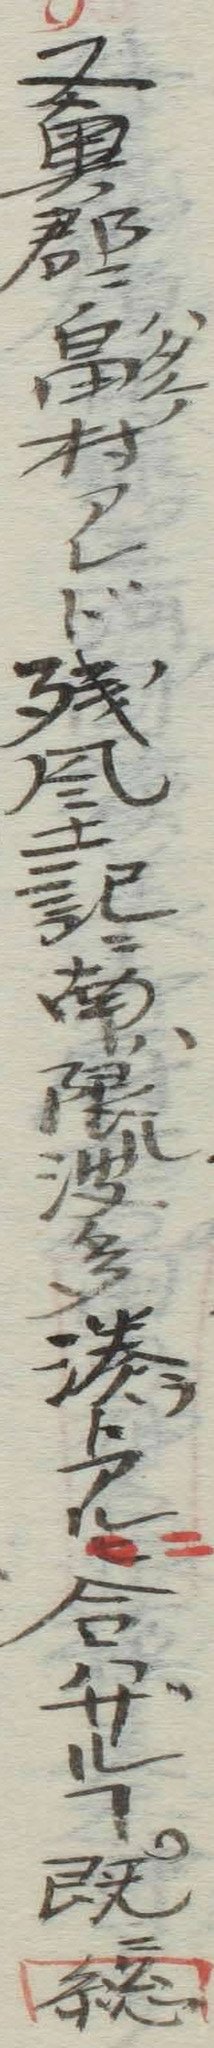○又奥郡ニ畠村アレド残風土記ニ南ハ限ル波多湊トアルニ合ハザルコト。既ニ総
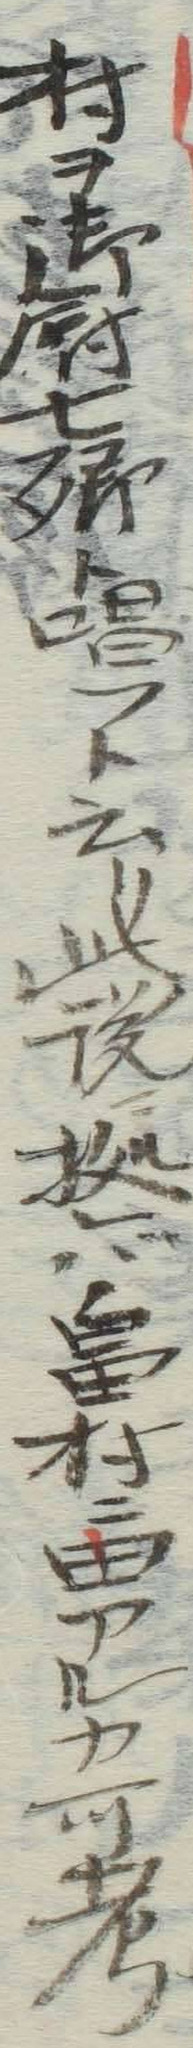村ヲ御厨七郷ト唱フト云リ此説ニ拠レバ畠村ニ由アルカ可考。
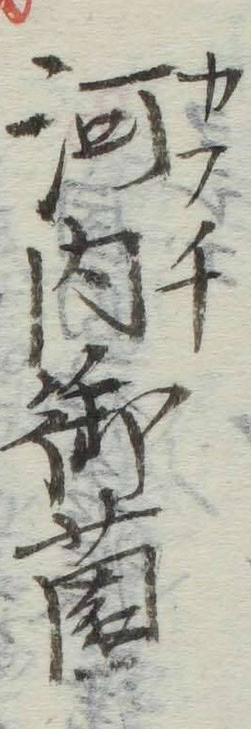河内御薗
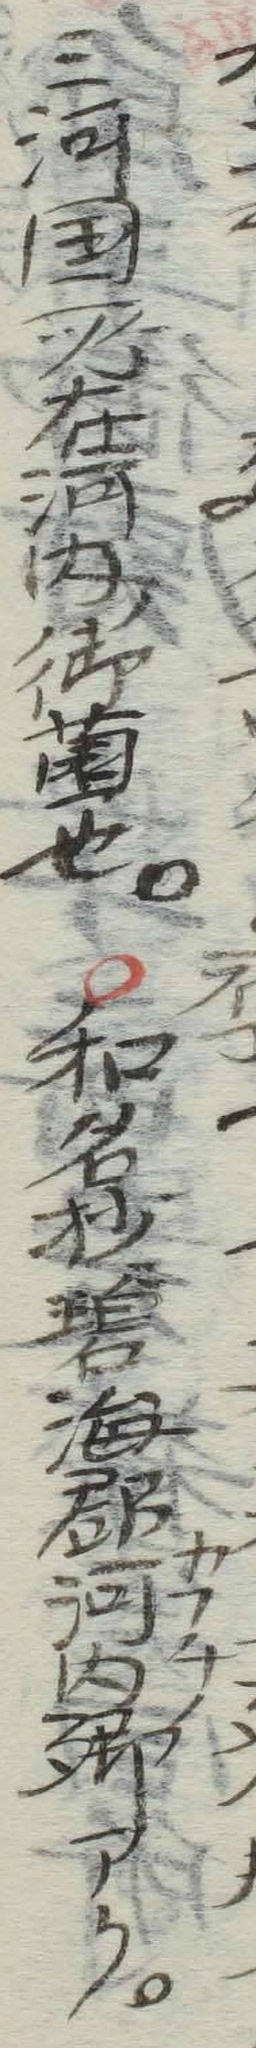三河国所在河内御薗也。○和名抄碧海郡河内郷アリ。
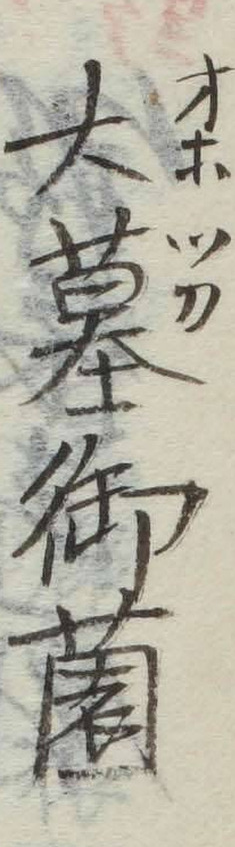大墓御薗
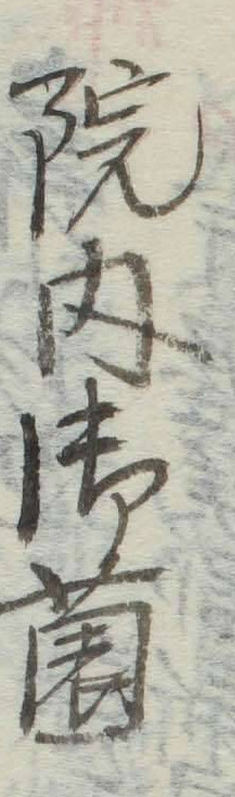院内御薗
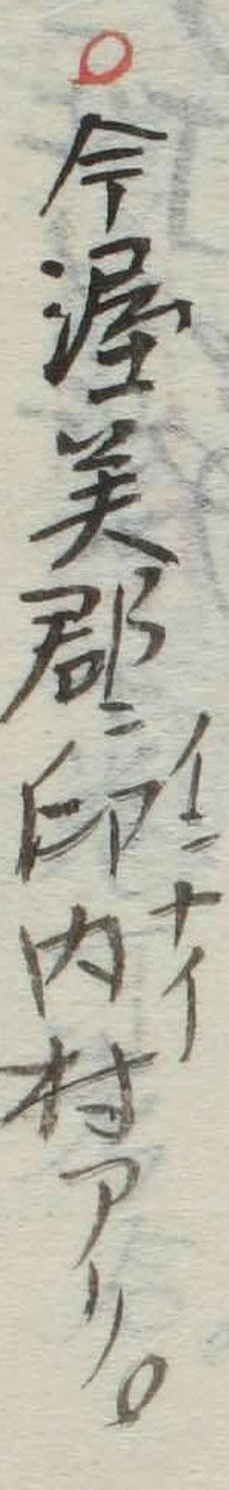○今渥美郡ニ印内村アリ。

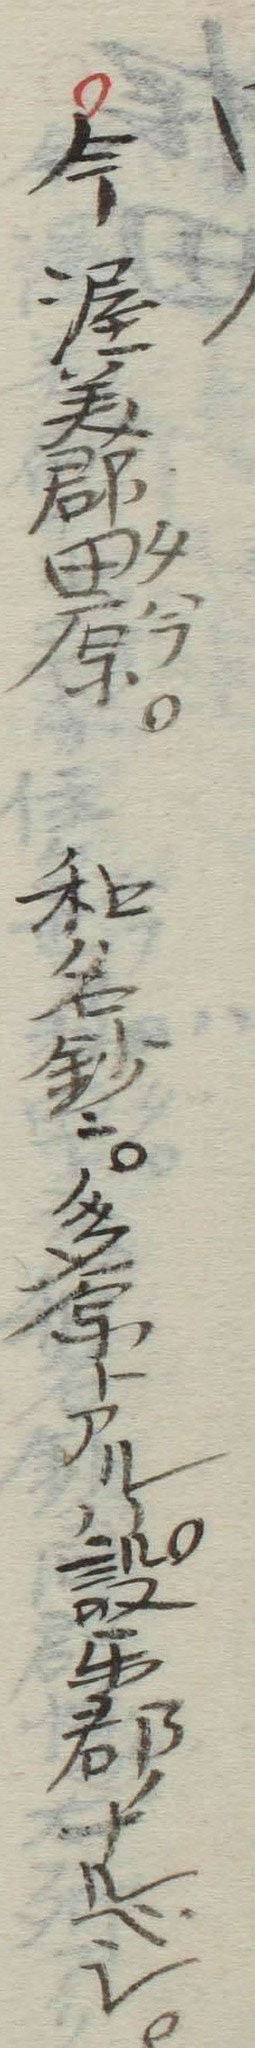○今渥美郡田原。和名鈔ニ。多原トアルハ。設楽郡ノナルベシ。
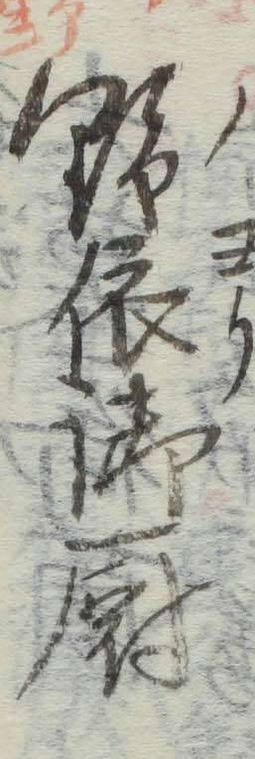野依御厨
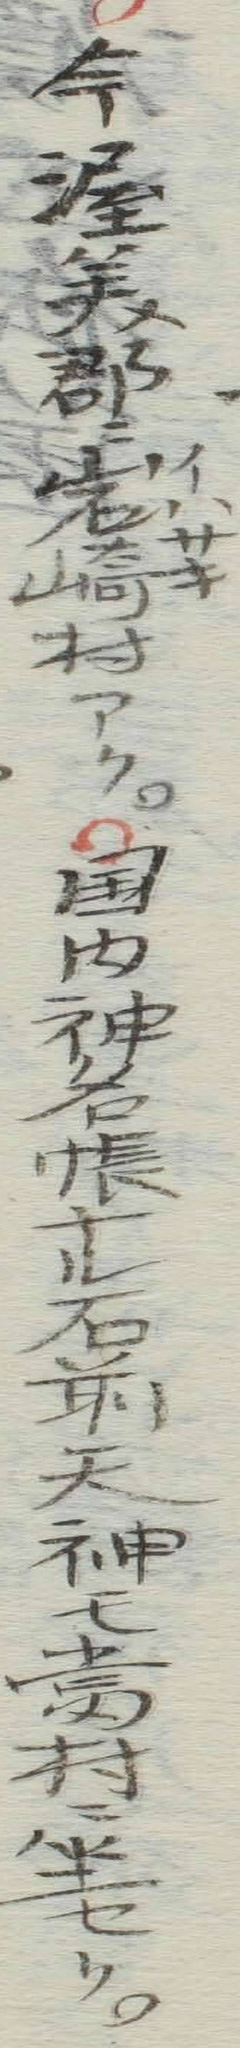○今渥美郡ニ岩崎村アリ。○国内神名帳ナル石前天神モ当村ニ坐セリ。
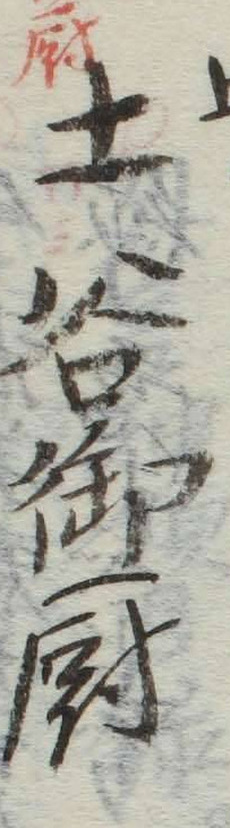土谷御厨
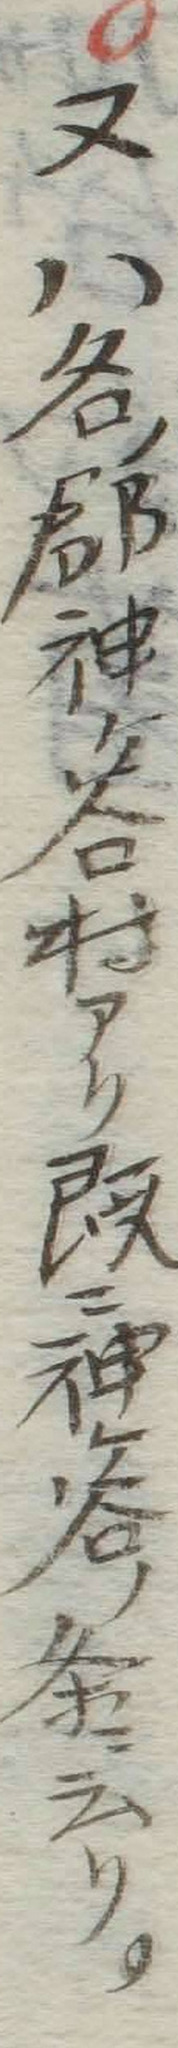○又八名郡神ケ谷村アリ既ニ神ケ谷ノ条云リ。
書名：神戸御厨御薗考
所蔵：国文学研究資料館
